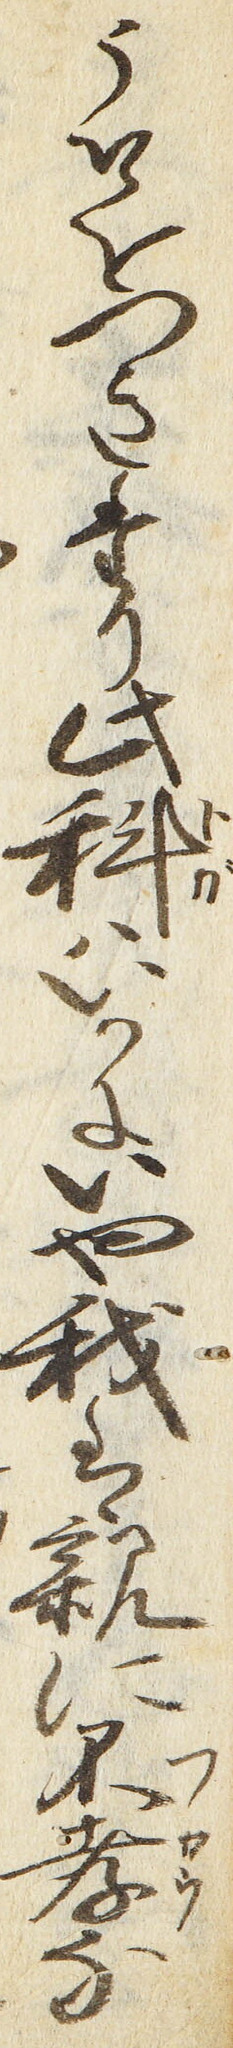うそをつきたり此科はいかにいや我は親に不孝な
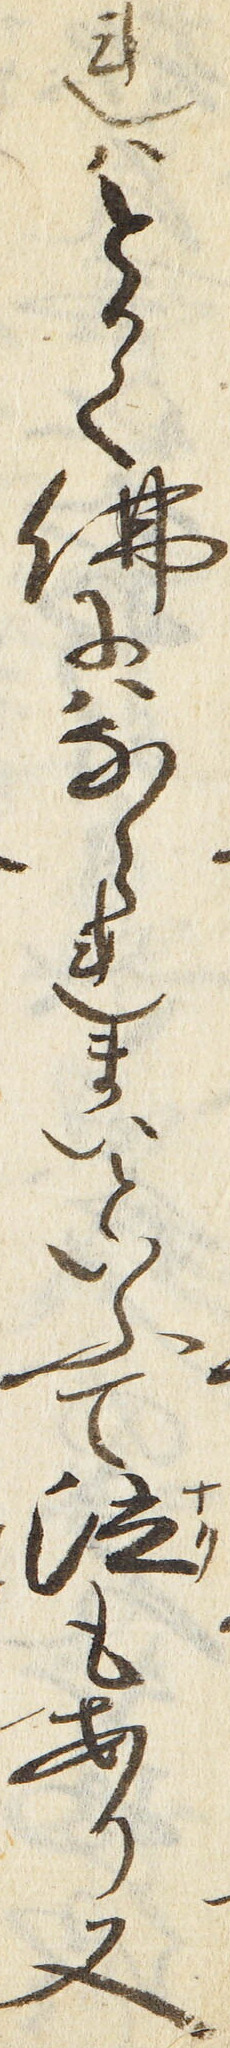れはとかく仏にはなられまいといふて泣もあり又
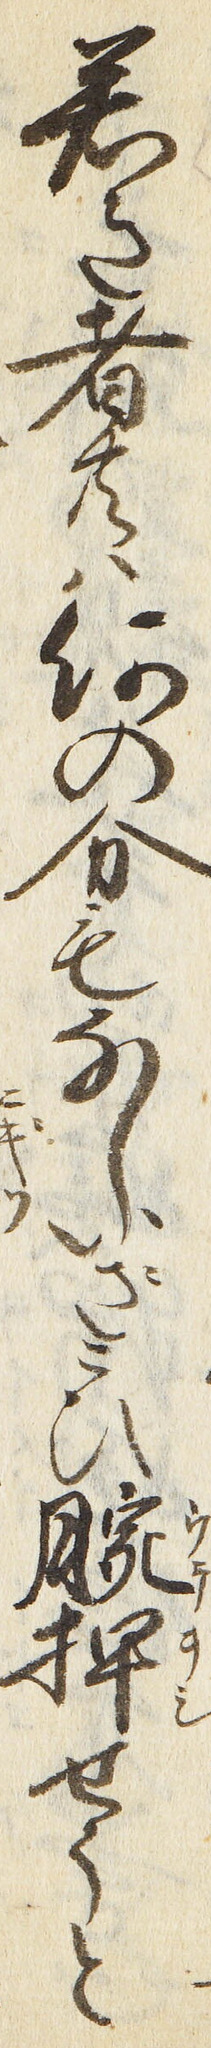若き者共は何の分もなしいざこひ腕押せうと
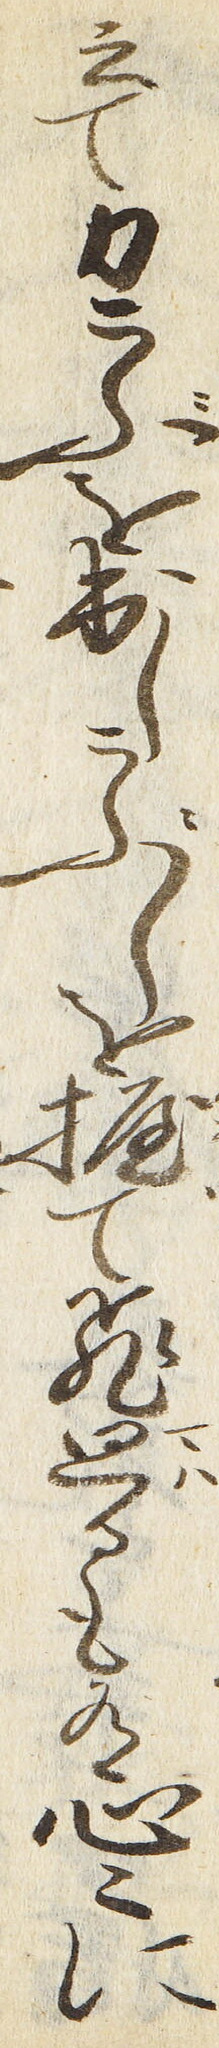云て力こぶを出しこぶしを握て飛廻るも有心々に
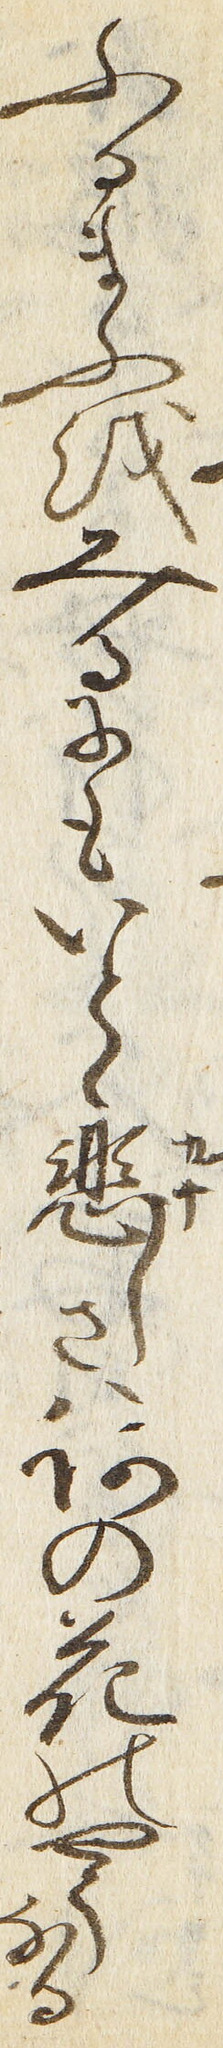ふるまふをみるにもいとゝ悲しさはあの花のやうなる
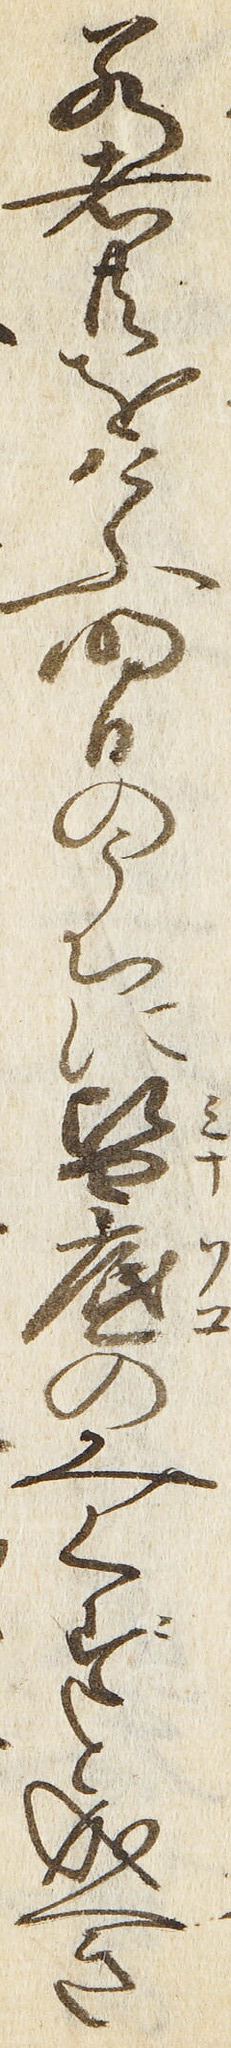若者共をけふ明日のうちに皆底のみくずと成へき
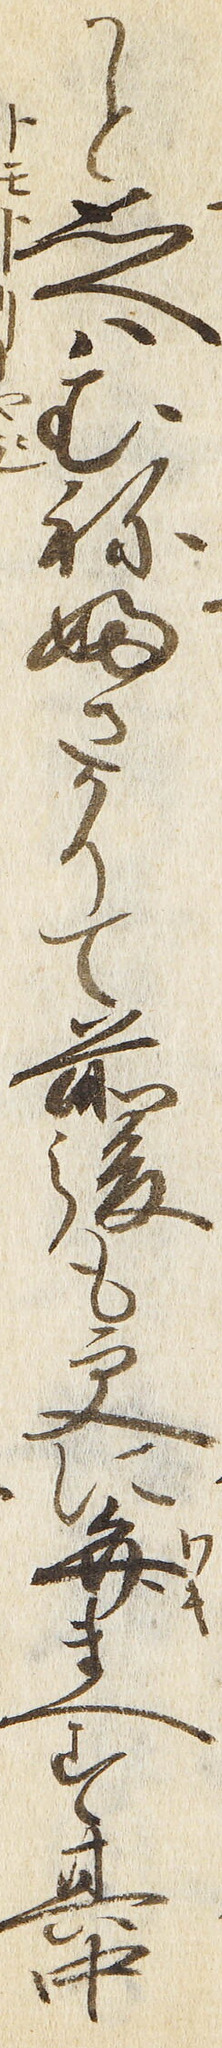こと思へはむねふさかりて前後も更に弁まへす其中
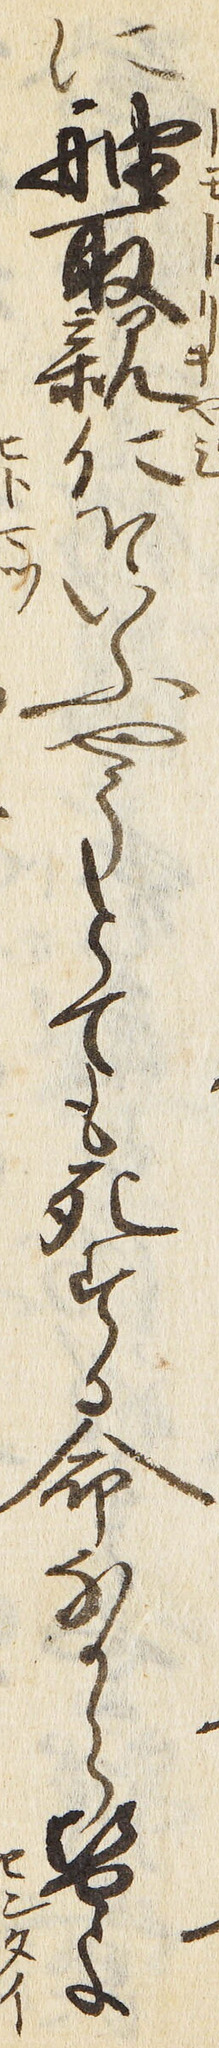に艫取親仁そいふやうとても死する命なから皆に
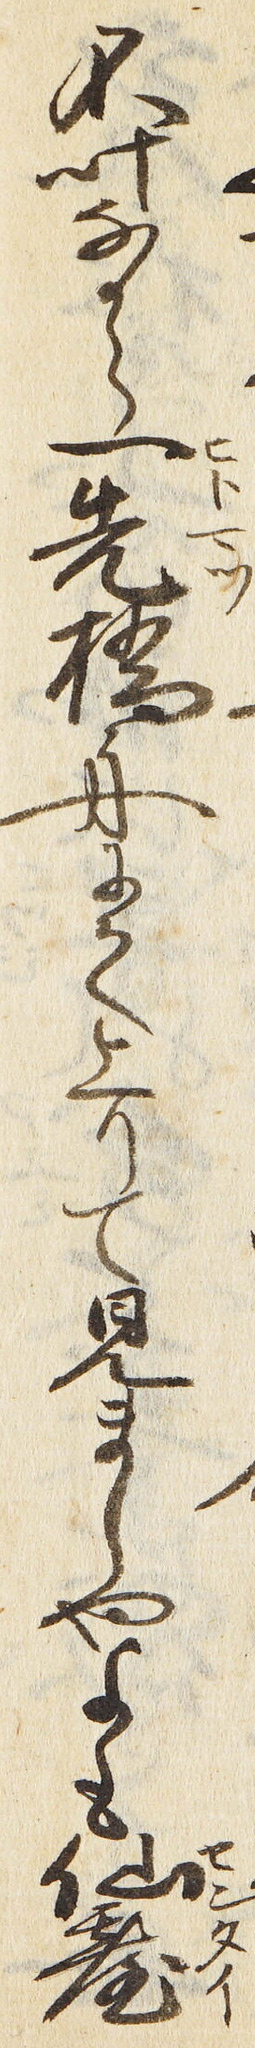不叶なから一先橋舟にて上りて見ましやよも仙台
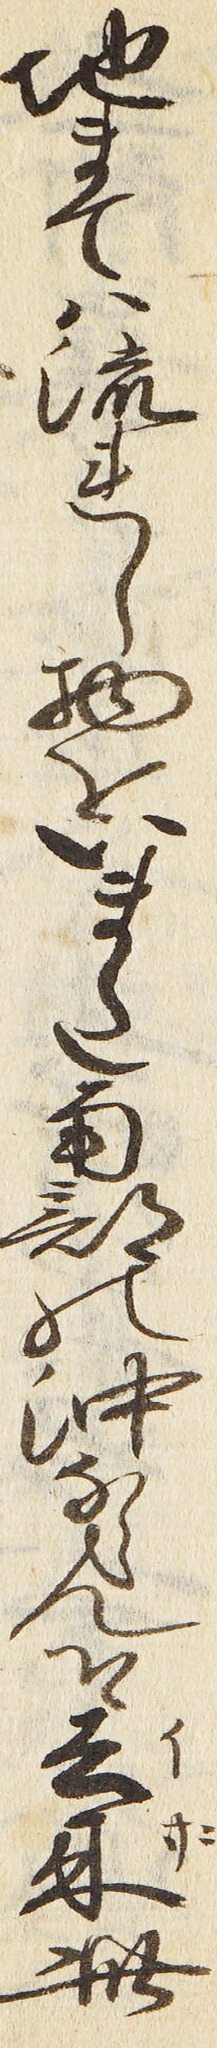地まては流れし物をいまた南部の沖ならんそ去来此
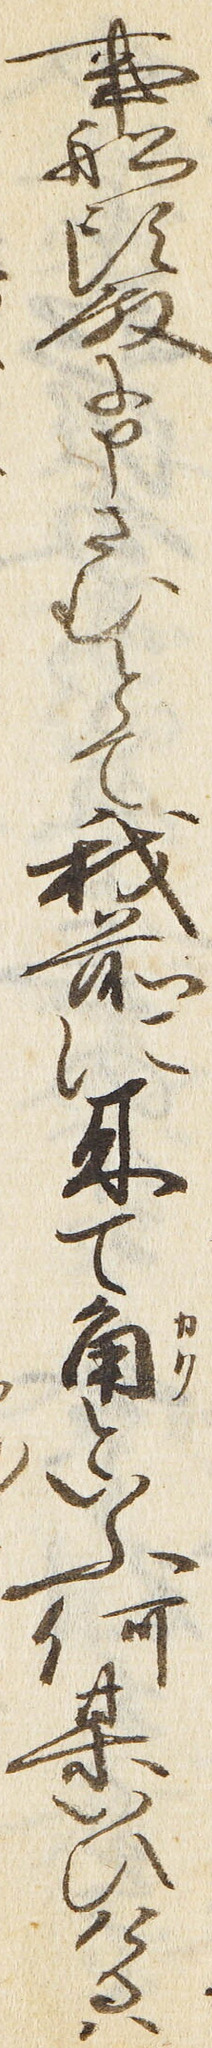事船頭殿に申さむとて我前に来て角といふ何某いひけるは
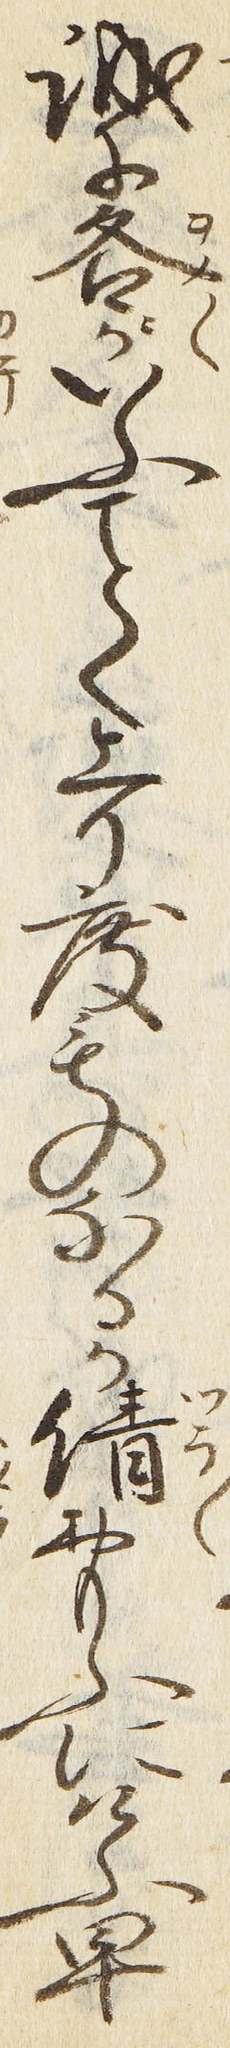誠に各がいふことく上り度ものなるか倩おもふにけふ早
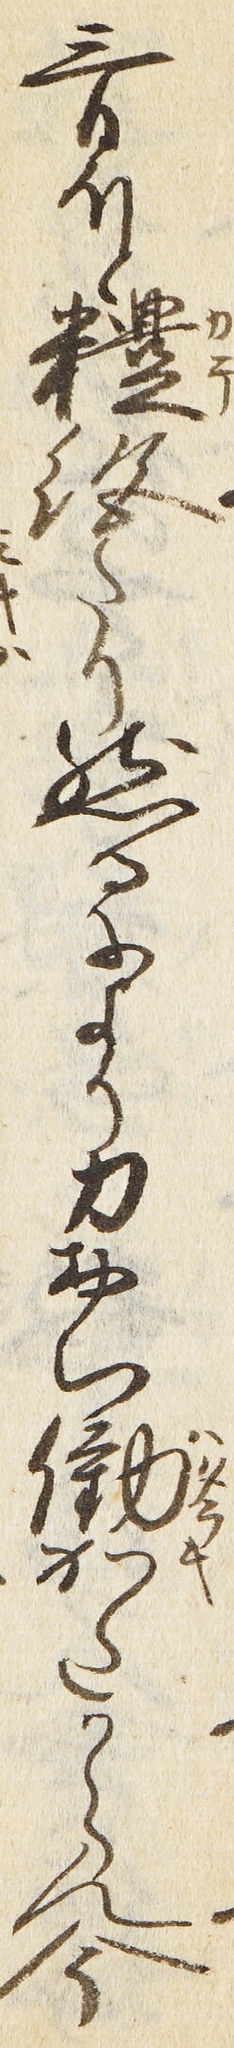三日ほと糧絶たり然るにより力おち働かたからん今
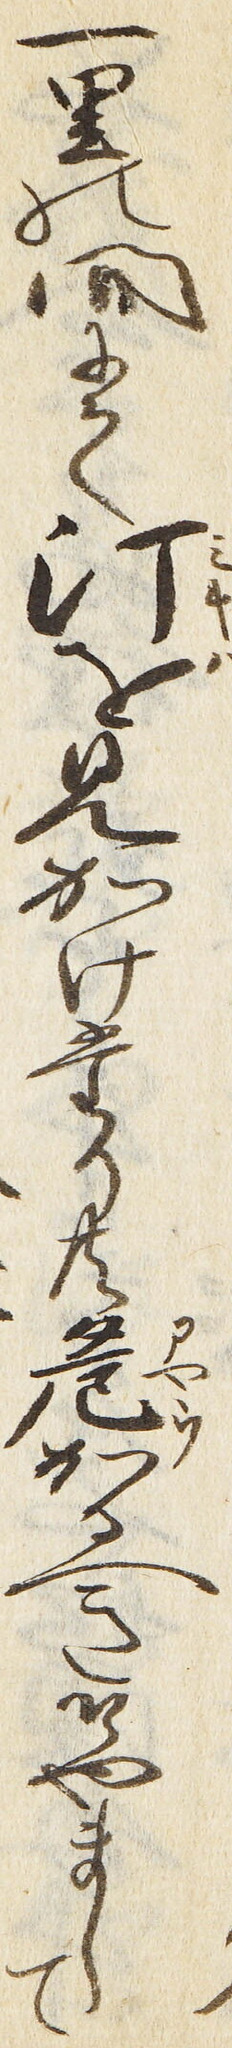一里の間にて汀を見かけたり共危かるへきそやまして
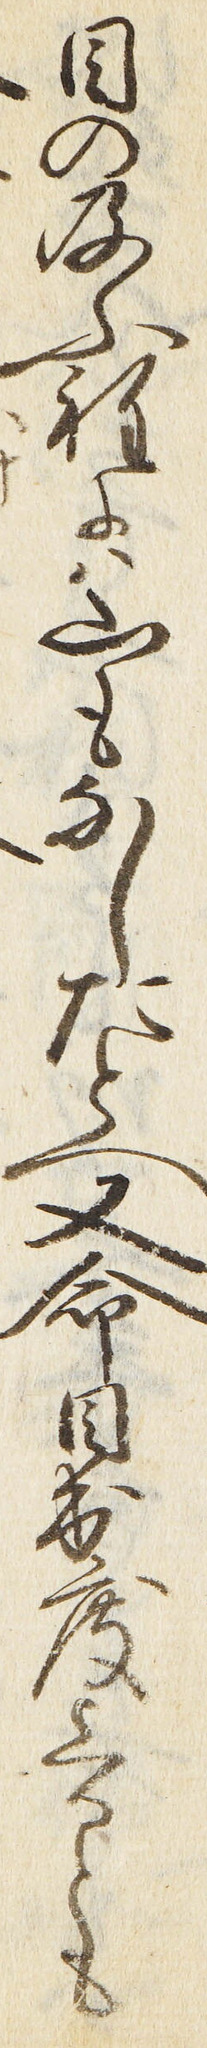目の及ふ程には山もなしたとへ又命目出度上るとも
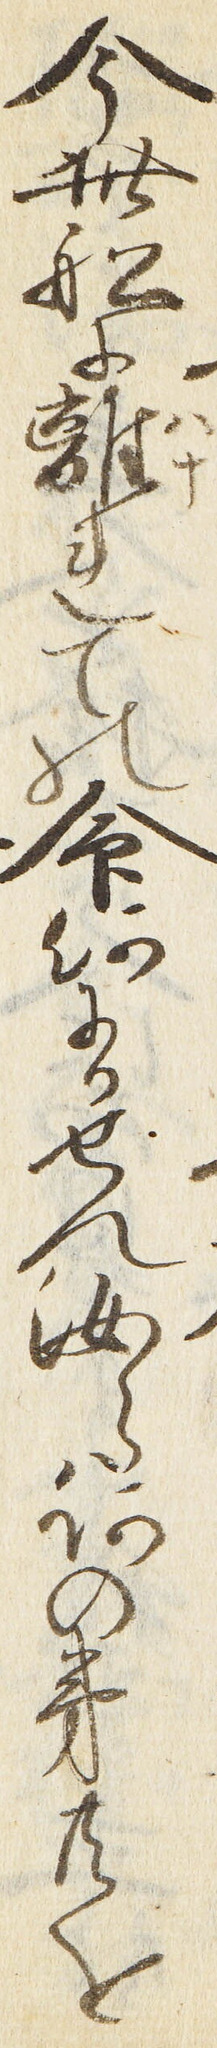今此船に離れての命何にかせん汝らはあの弟共を
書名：海陸世話日記
